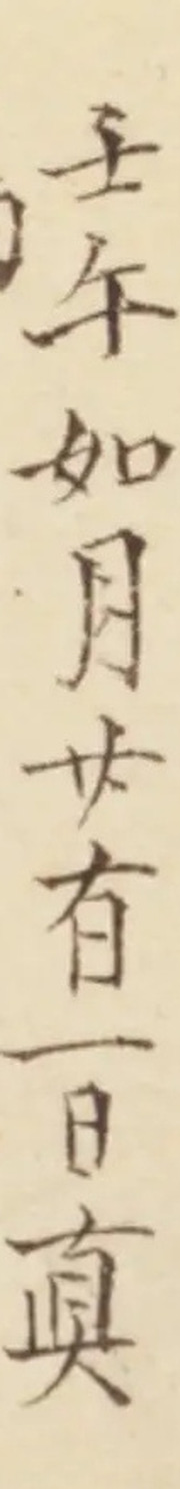壬午如月廿有一日真
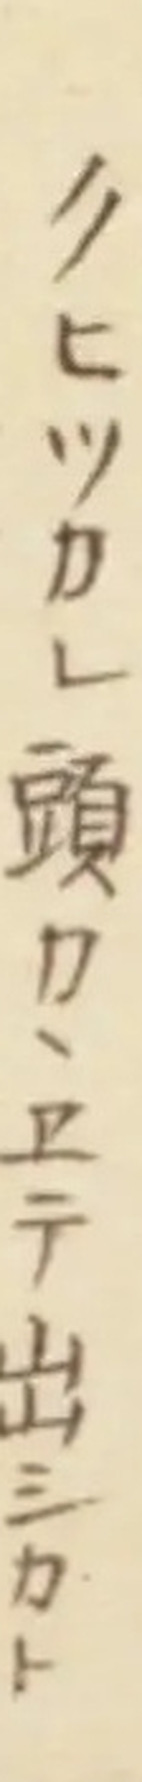クヒツカレ頭カヽエテ出シカト
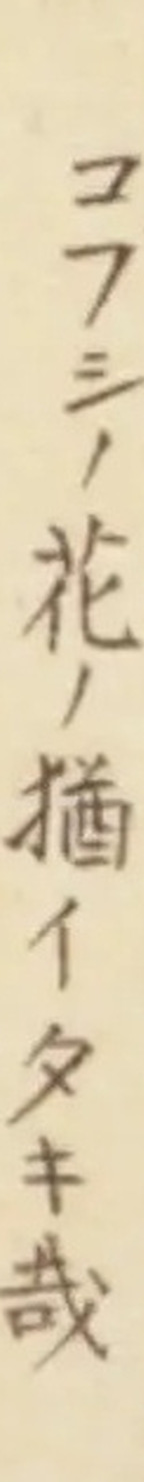コブシノ花ノ猶イタキ哉
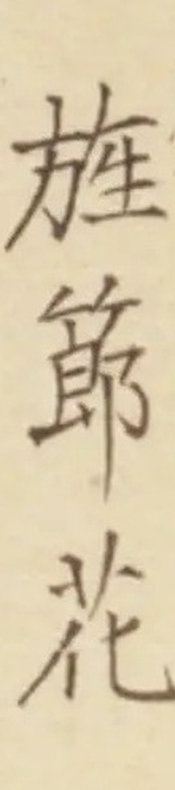旌節花
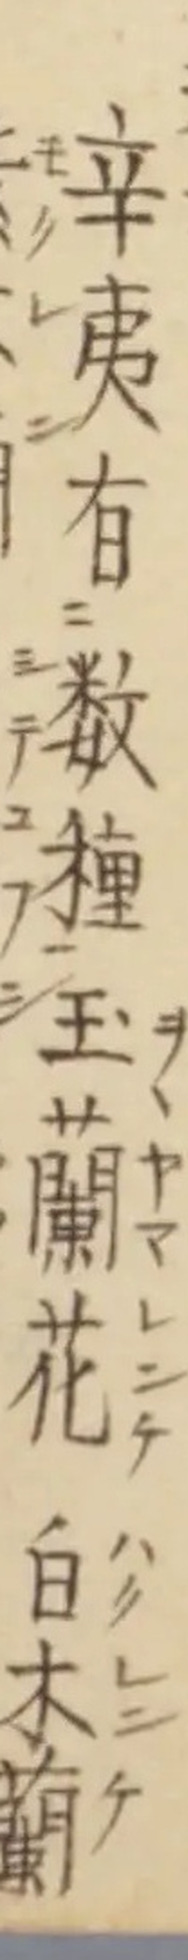辛夷有数種玉蘭花白木蘭
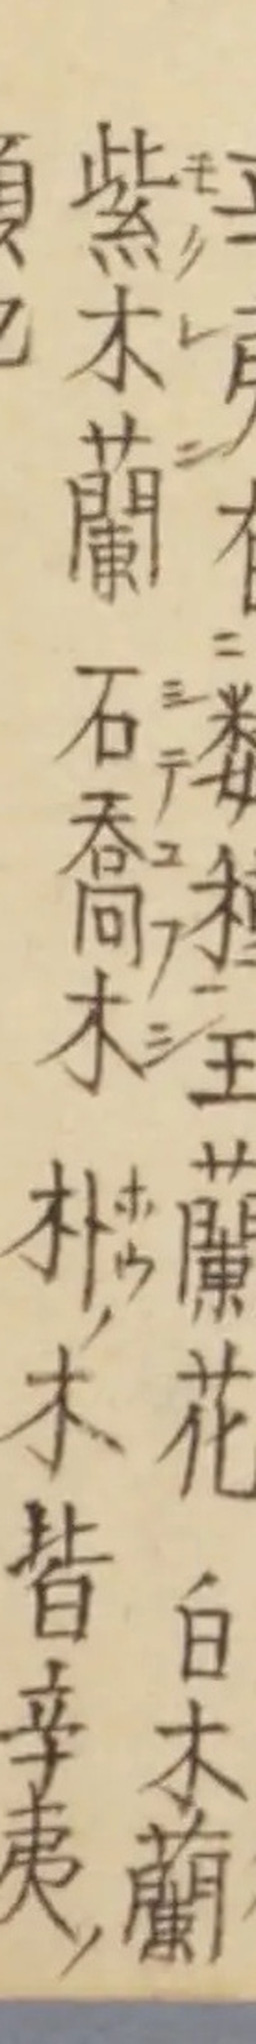紫木蓮石喬木朴木皆辛夷
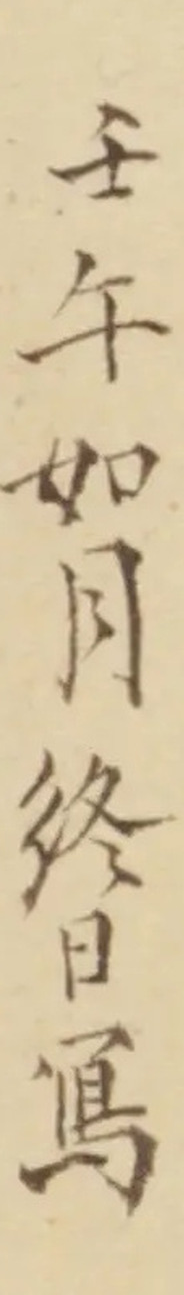壬午如月終日写

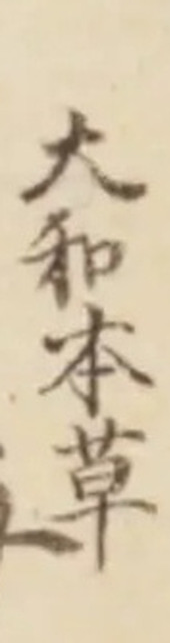大和本草
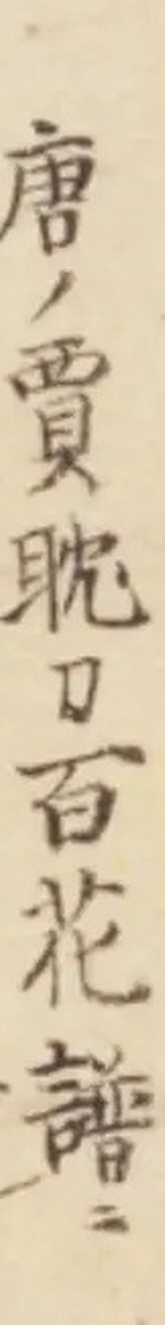唐ノ賈耽カ百花譜
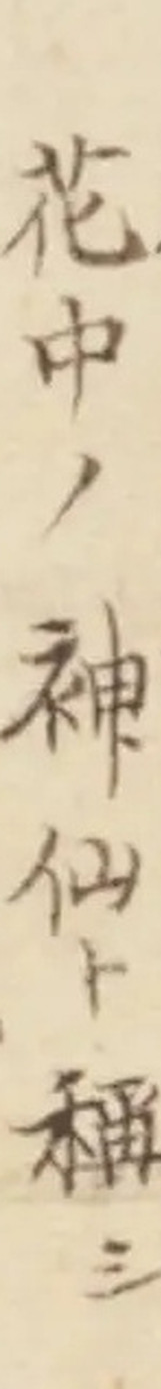花中ノ神仙ト称シ
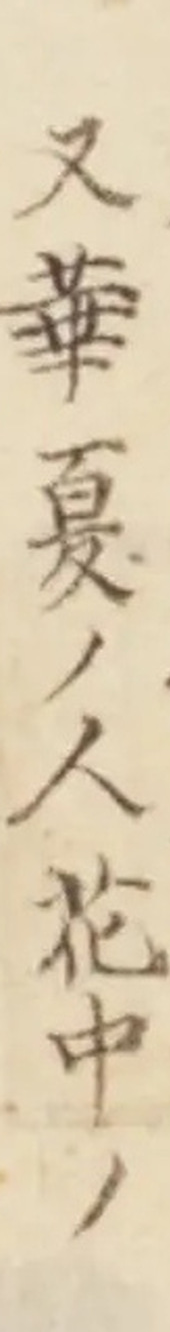又華夏ノ人花中ノ
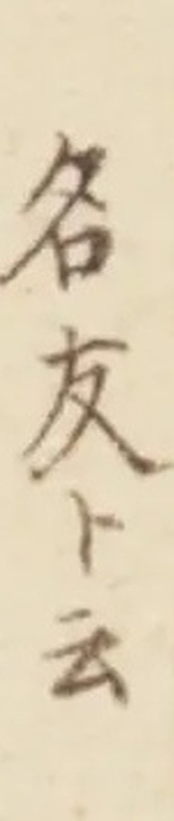名友ト云
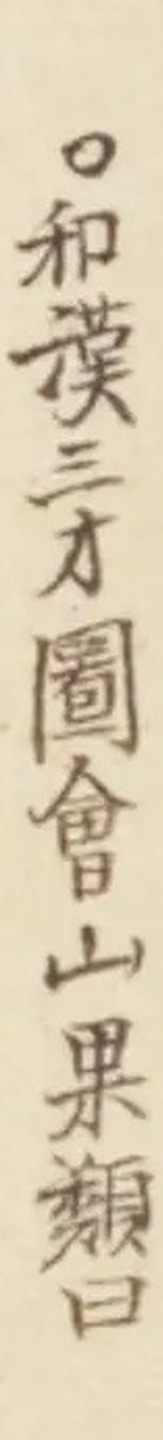○和漢三才図会山果類曰
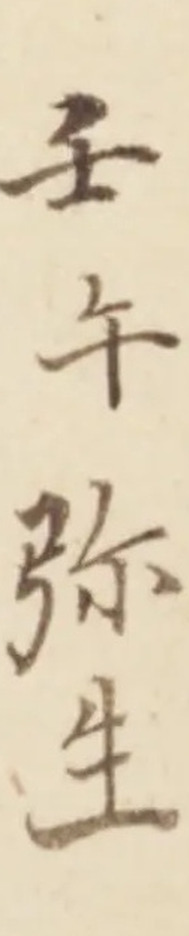壬午弥生
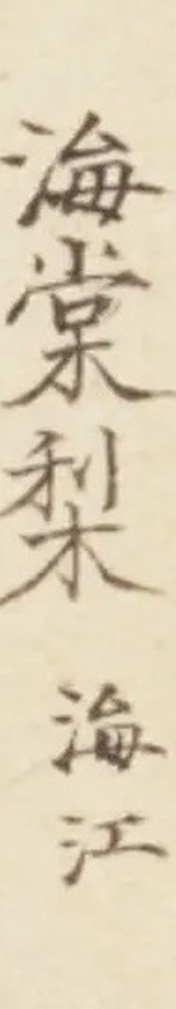海棠梨海江
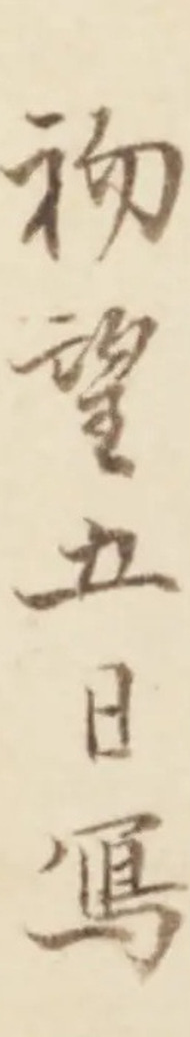初望五日写
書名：梅園草木花譜春之部. 1
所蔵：国立国会図書館 National Diet Library, JAPAN
